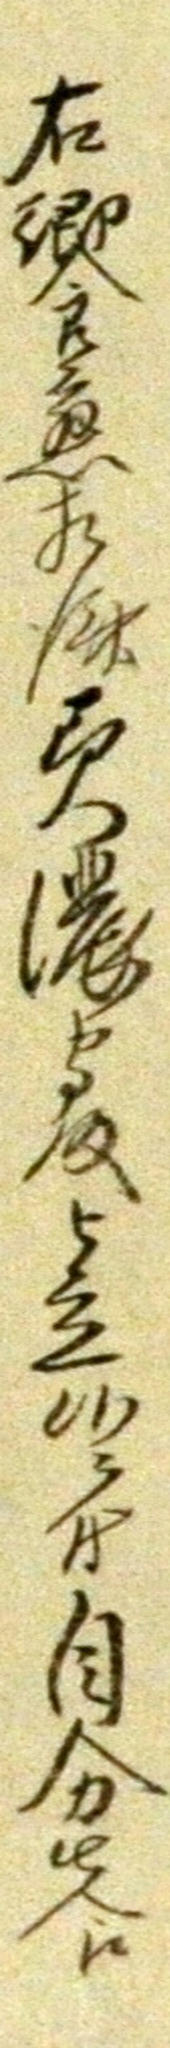右饗応相済美濃守殿被立候ニ付自分先え
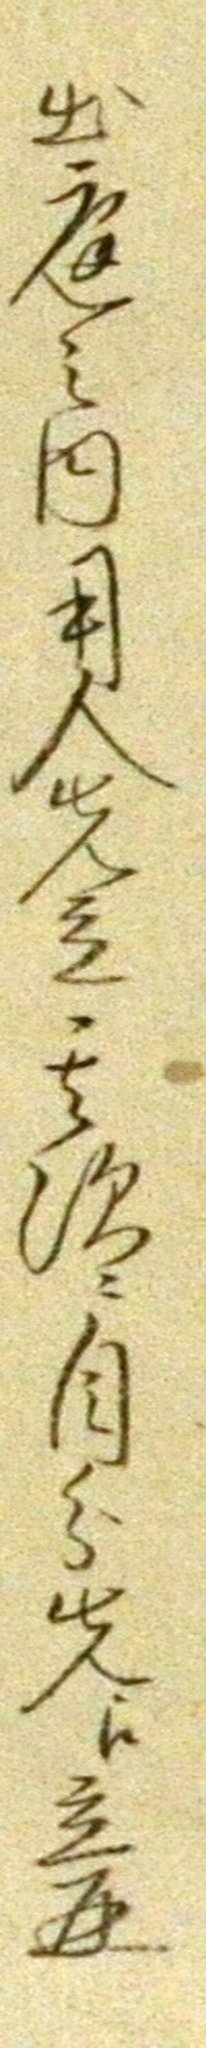出逢之内用人先立其次ニ自分先え立再
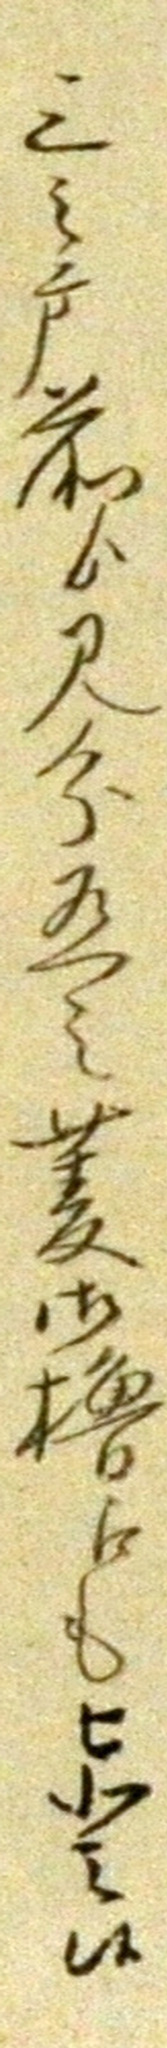三之戸前ゟ見分有之菱御櫓えも被登候
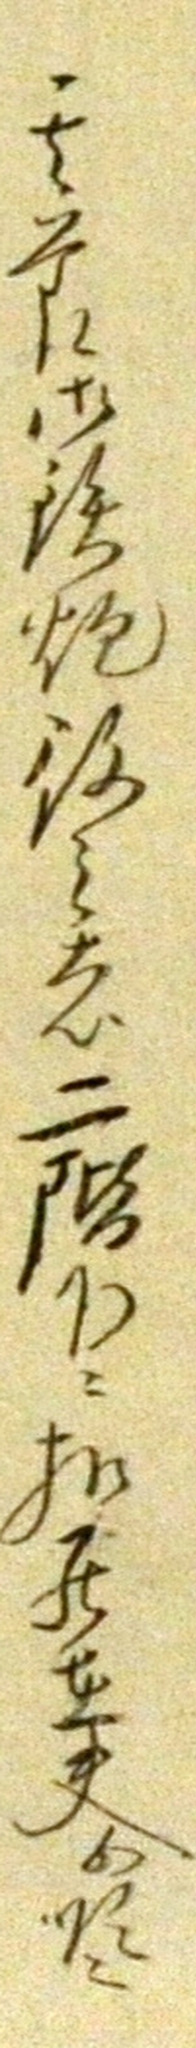其節御鉄砲役之者二階下ニ扣罷在夫ゟ順々
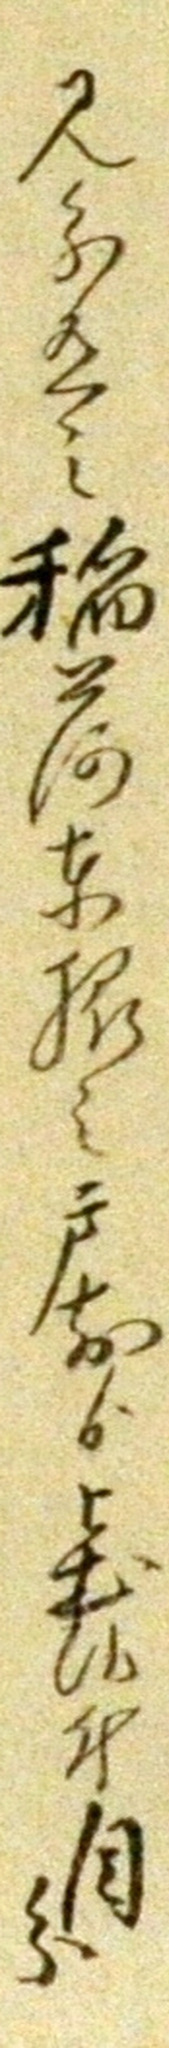見分有之稲荷東脇之戸前ゟ被出候付自分
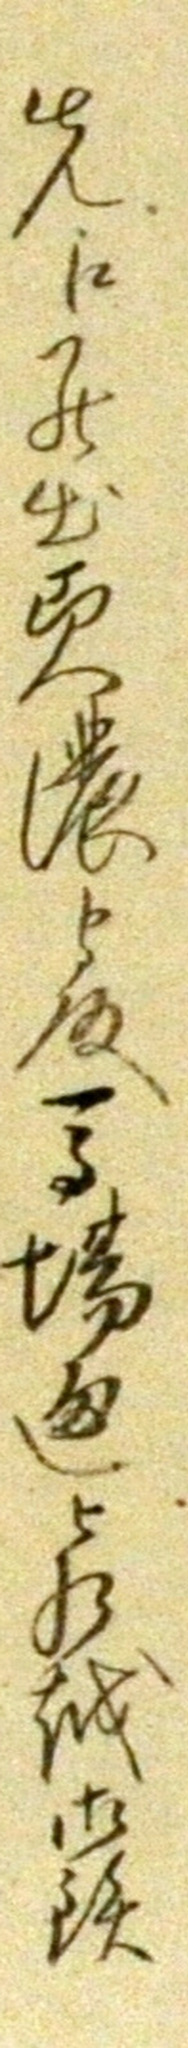先え罷出美濃守殿馬場通被相越御鉄
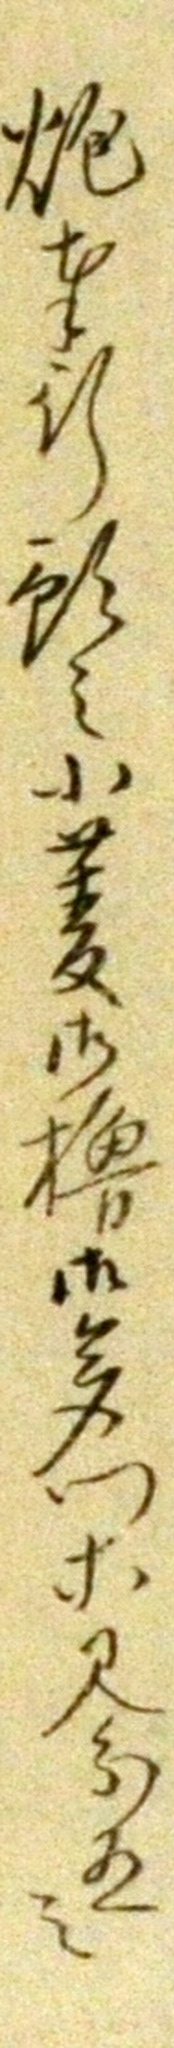炮奉行願之小菱御櫓御多門等見分有之
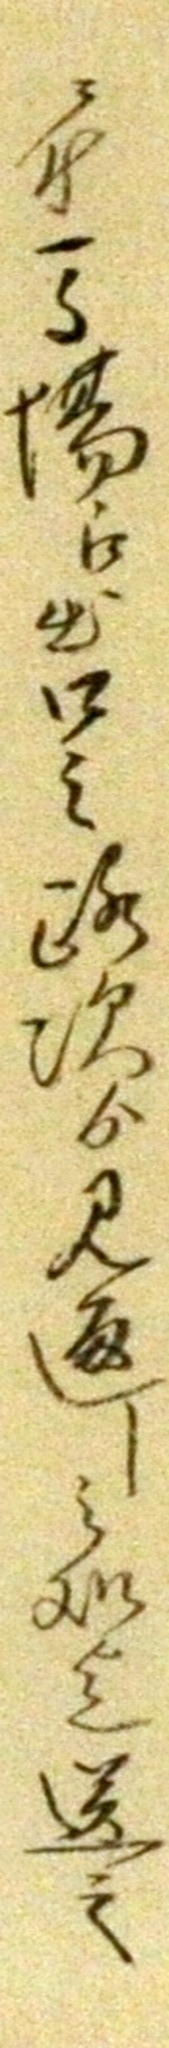ニ付馬場え出口之路次ゟ見通し之処迄送之
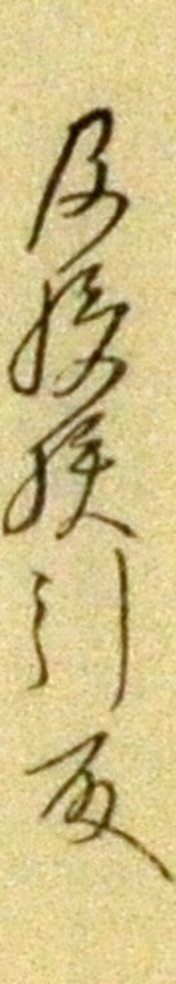及挨拶引取
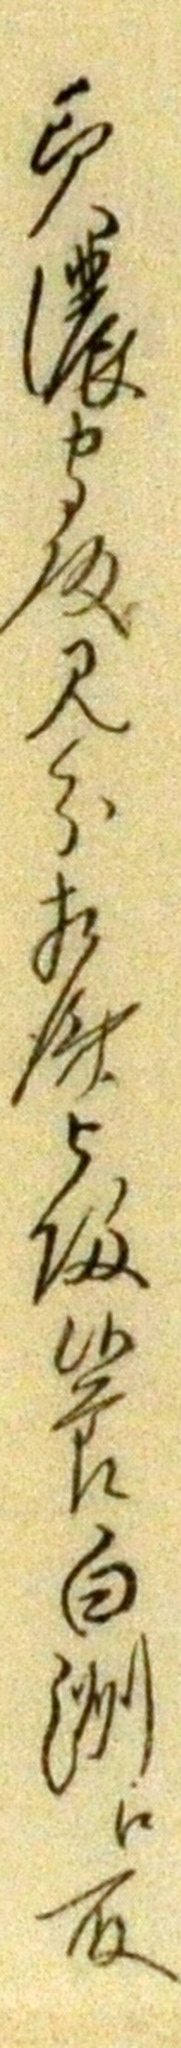美濃守殿見分相済被帰候節白洲え取
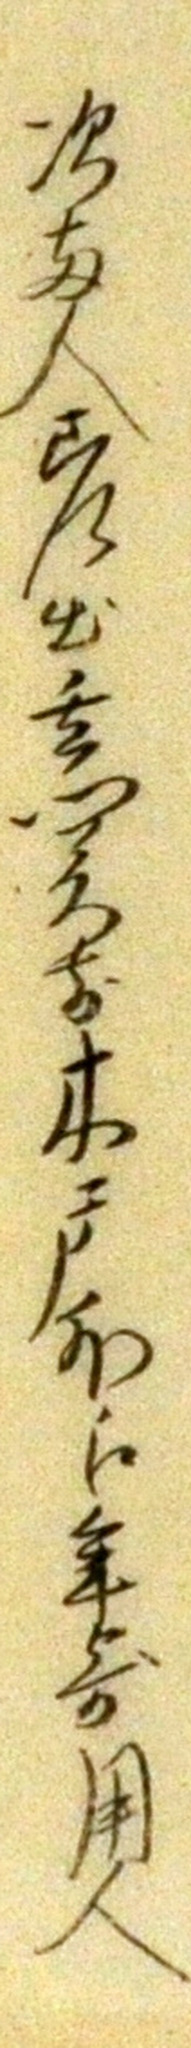次両人差出玄関前木戸外え年寄用人
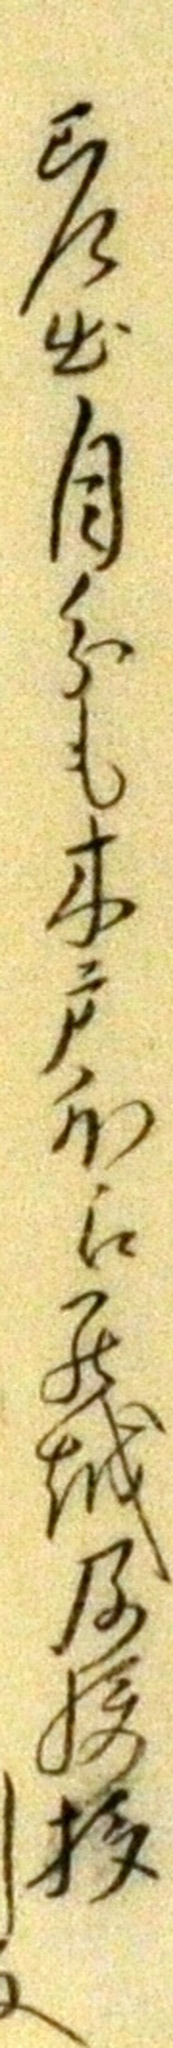差出自分も木戸外え罷越及挨拶引取
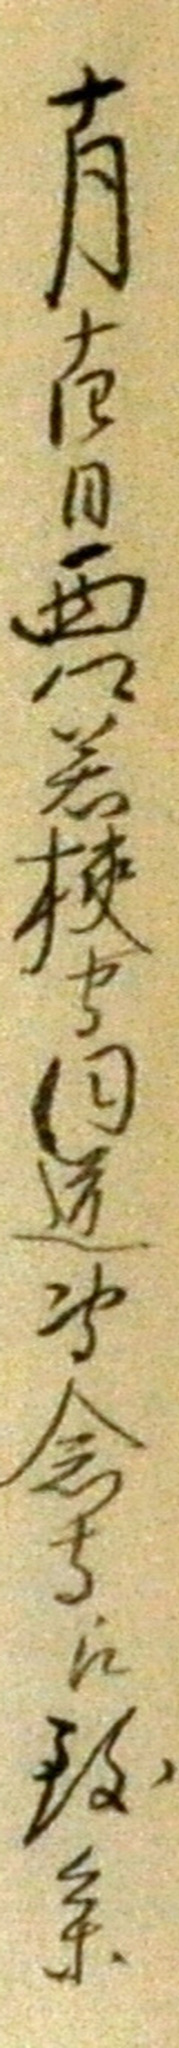十月十四日西郷若狭守同道専念寺え致参
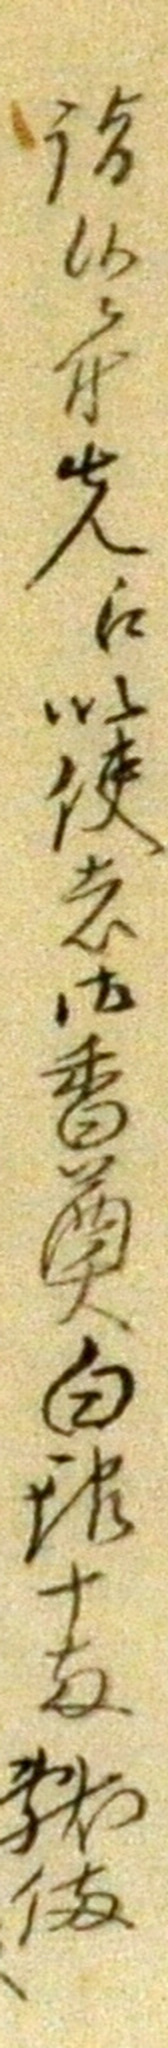詣候ニ付先え以使者御香典白銀十両献備之
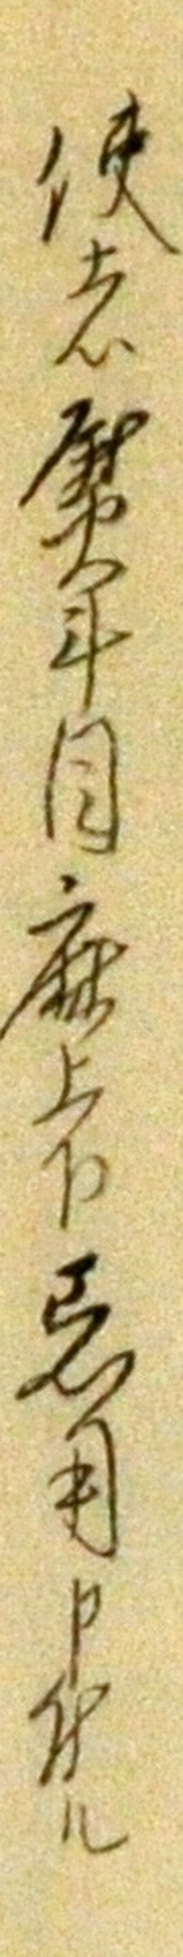使者熨斗目麻上下着用申付ル
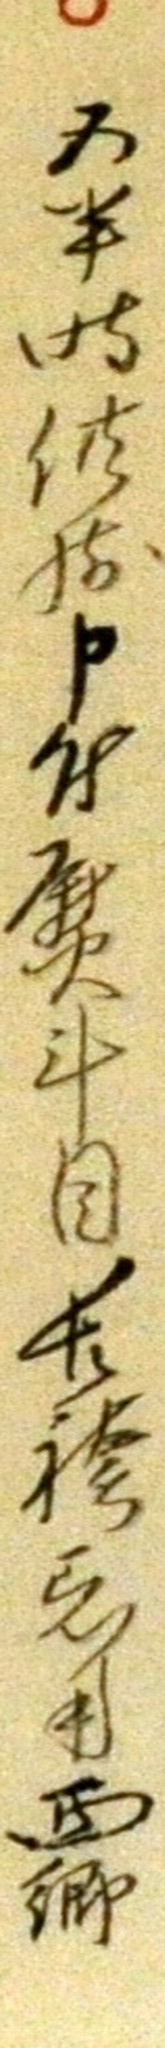五半時供揃申付熨斗目長袴着用西郷
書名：大阪加番関係諸書留〔一括〕
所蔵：伊那市立高遠町図書館・合同会社AMANE
